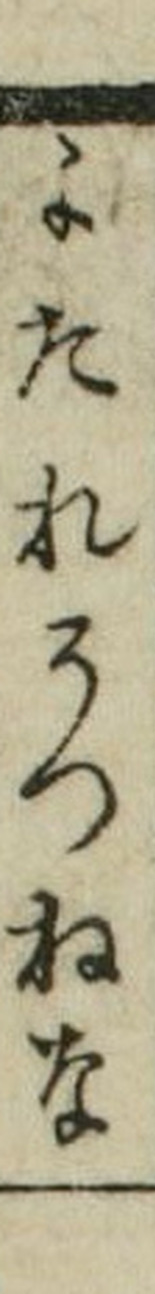よたれそつねな
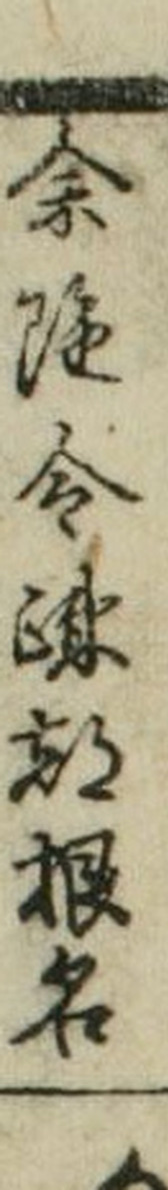余陀令疎都根名
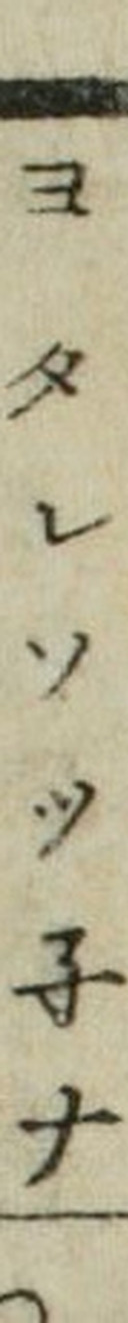ヨタレソツネナ
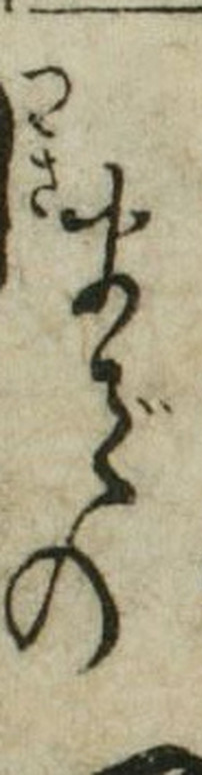までの
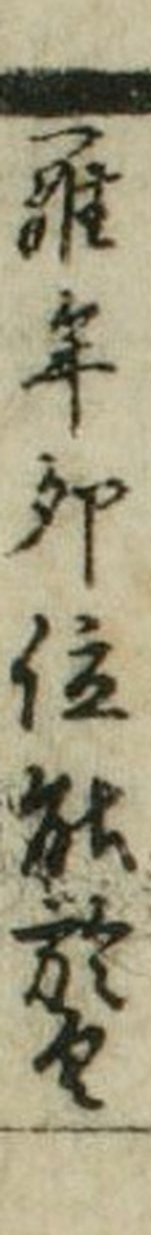羅牟卯位能於具
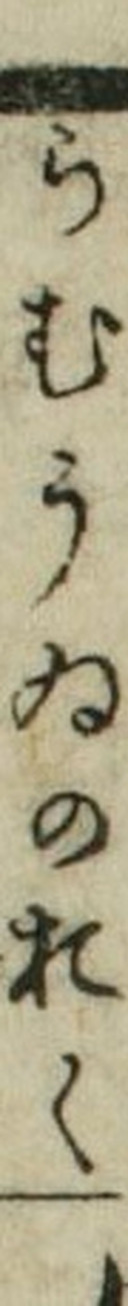らむうゐのおく
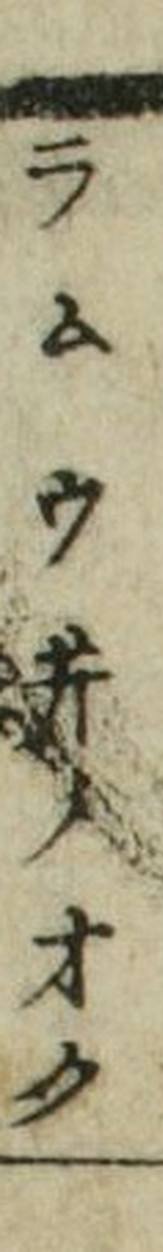ラムウヰノオク

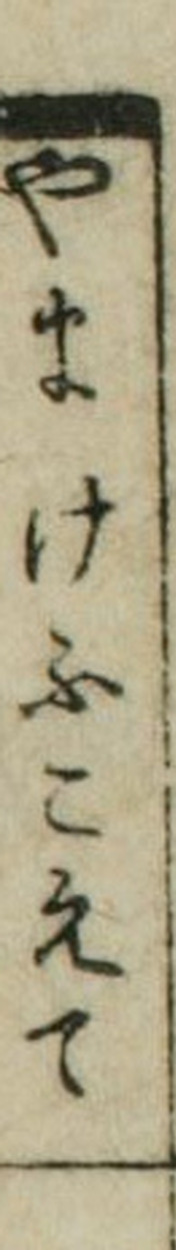やまけふこえて
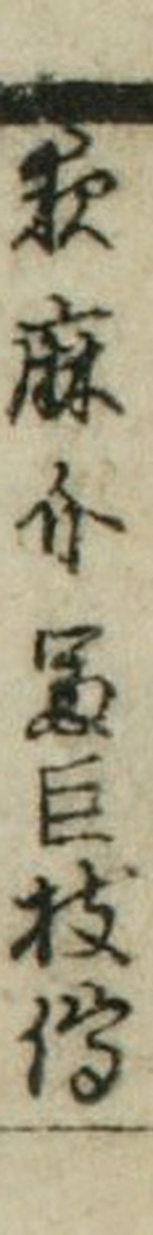夜麻介富巨枝転
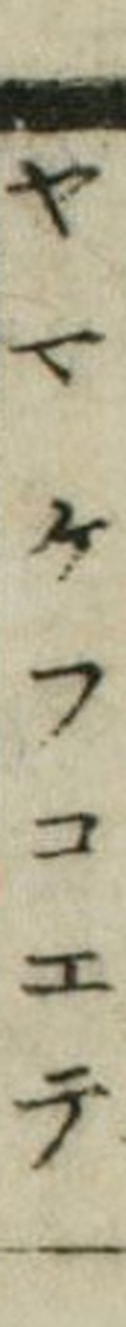ヤマケフコエテ
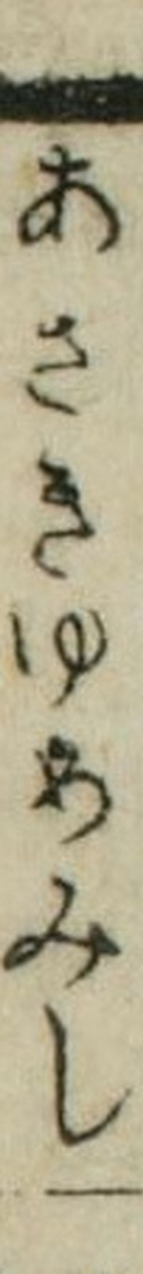あさきゆめみし
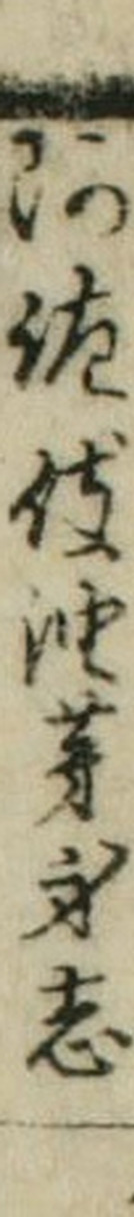阿佐伎油芽身志
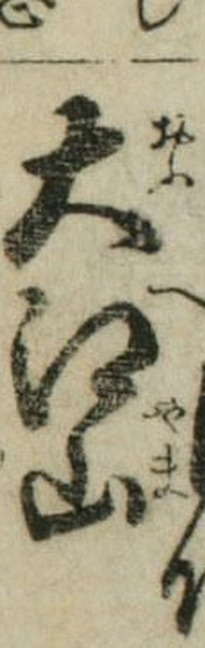大江山
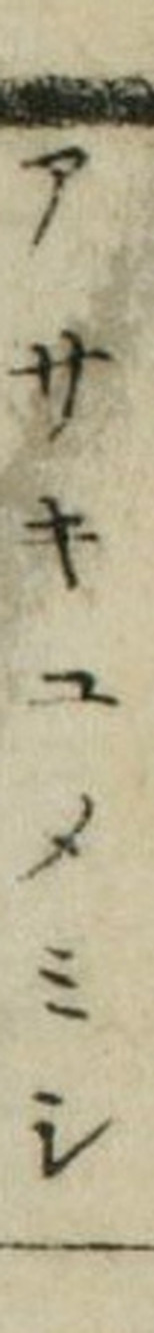アサキユメミシ
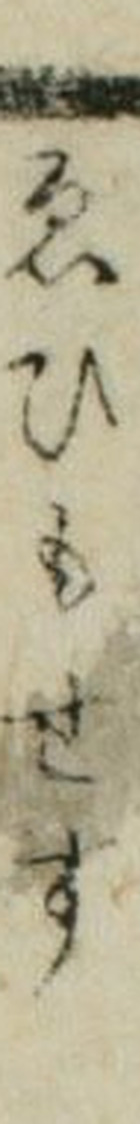ゑひもせす
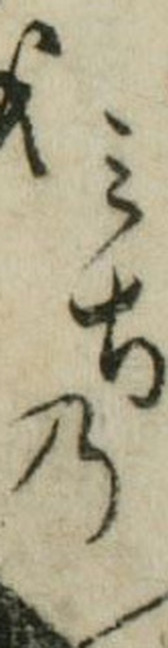みちの
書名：百人一首
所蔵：東京学芸大学教育コンテンツアーカイブ
